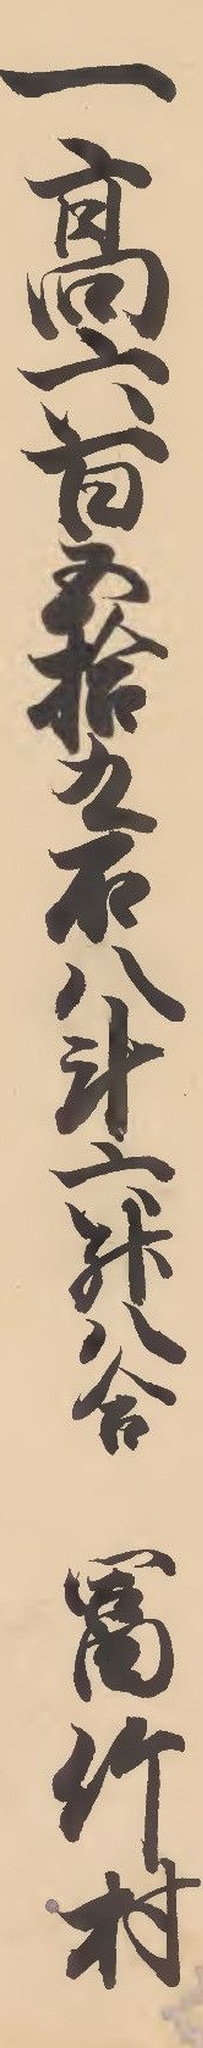一高六百五拾九石八斗六升八合富竹村
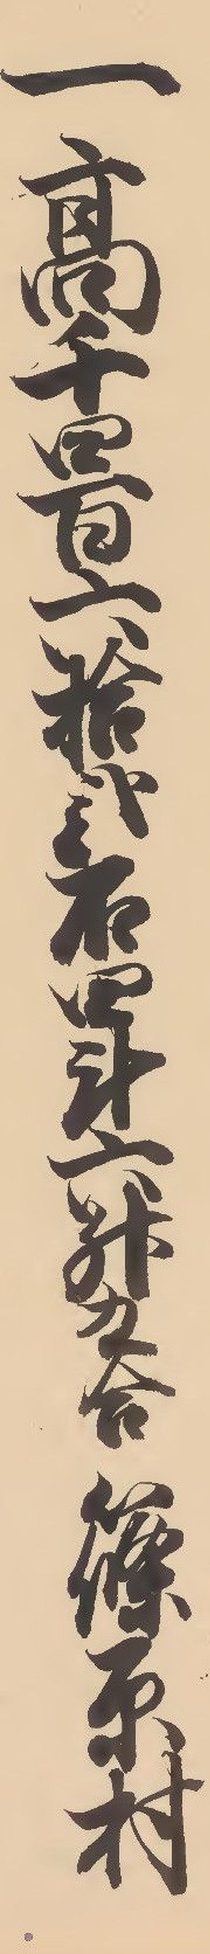一高千四百六拾弐石四斗六升九合篠原村
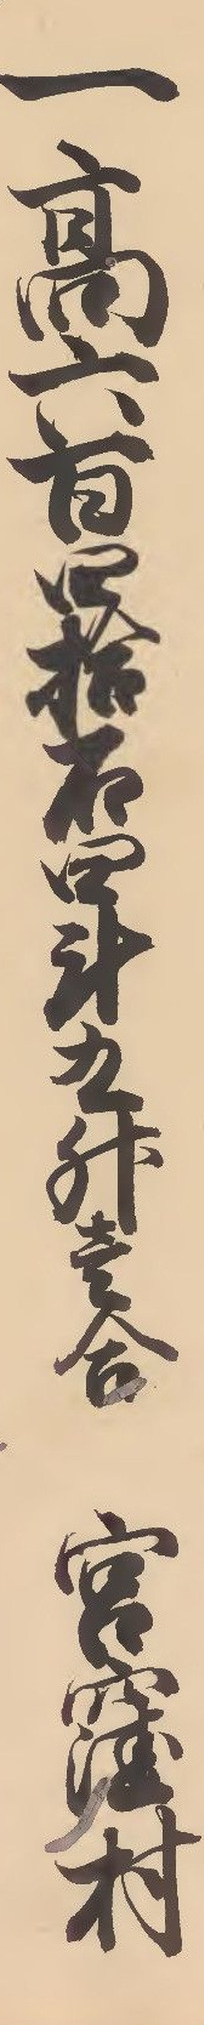一高六百四拾石四斗九升壱合宮窪村

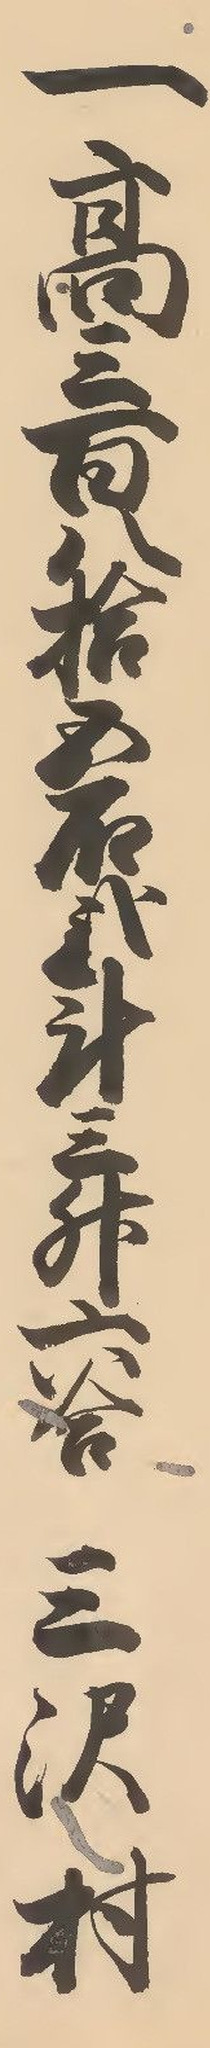一高三百八拾五石弐斗三升六合三沢村
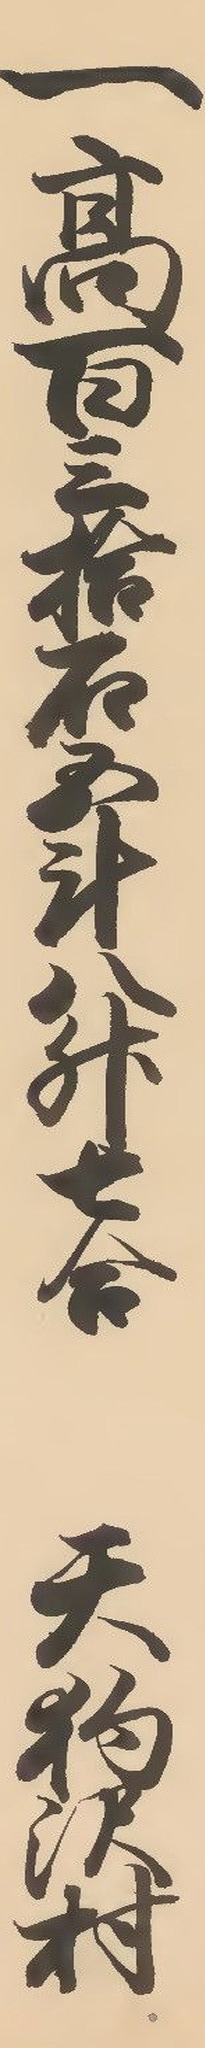一高百三拾石五斗八升七合天狗沢村
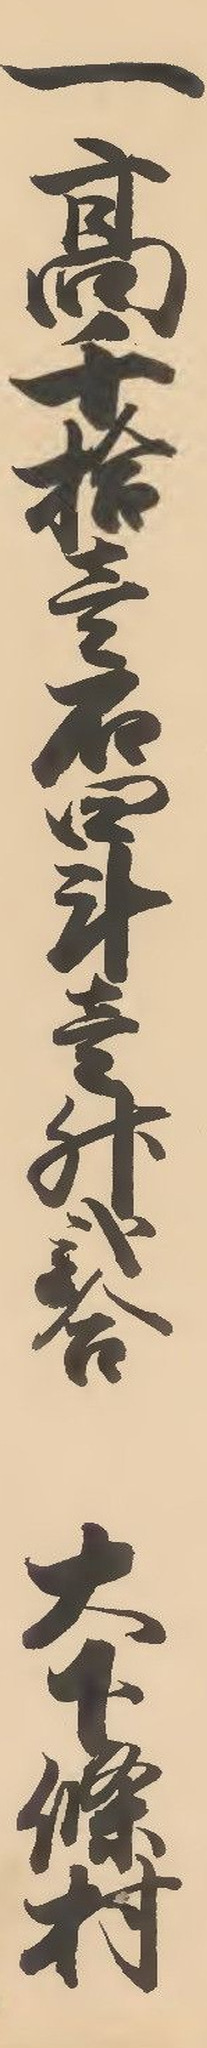一高千拾壱石四斗壱升弐合大下条村
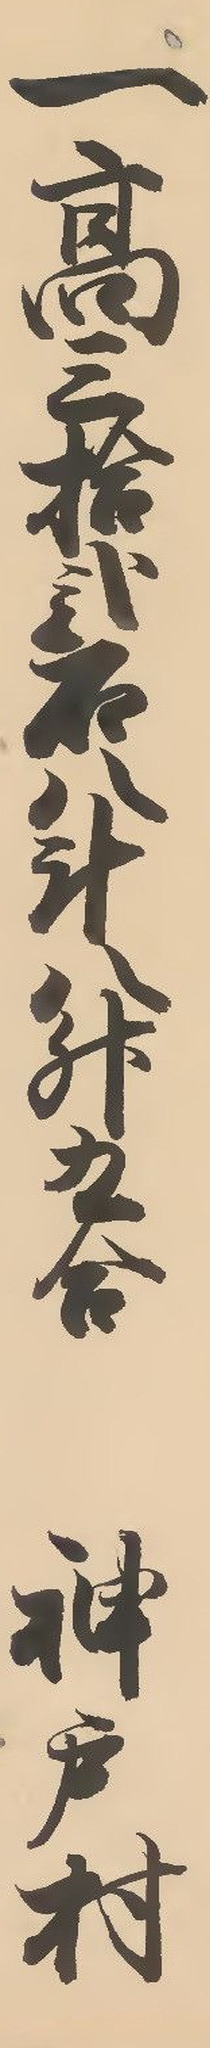一高三拾弐石八斗八升九合神戸村
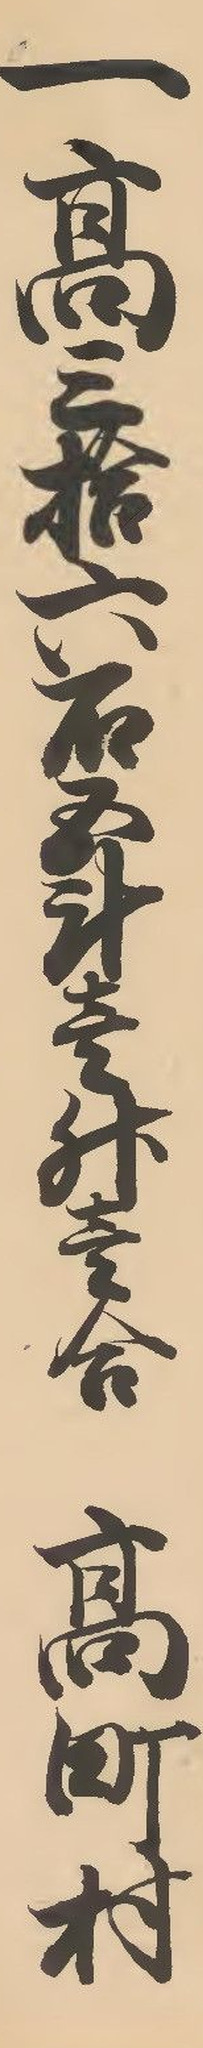一高三拾六石五斗壱升壱合高町村
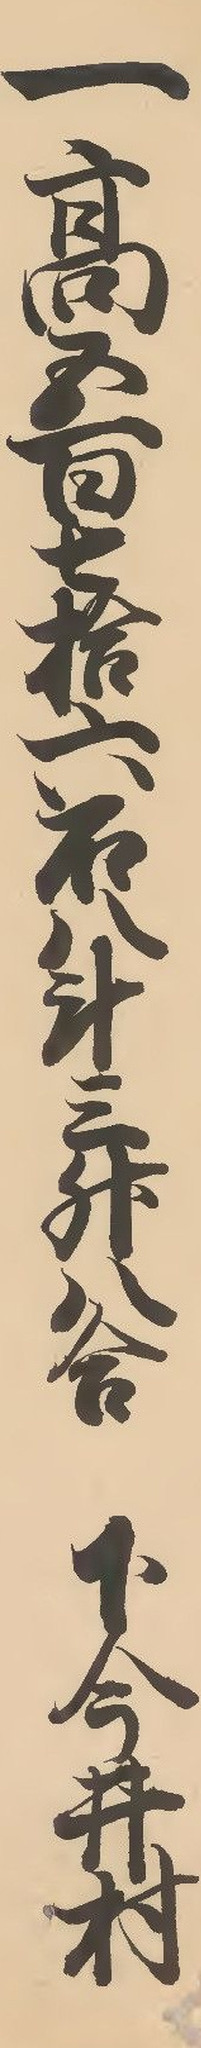一高五百七拾六石八斗三升八合下今井村
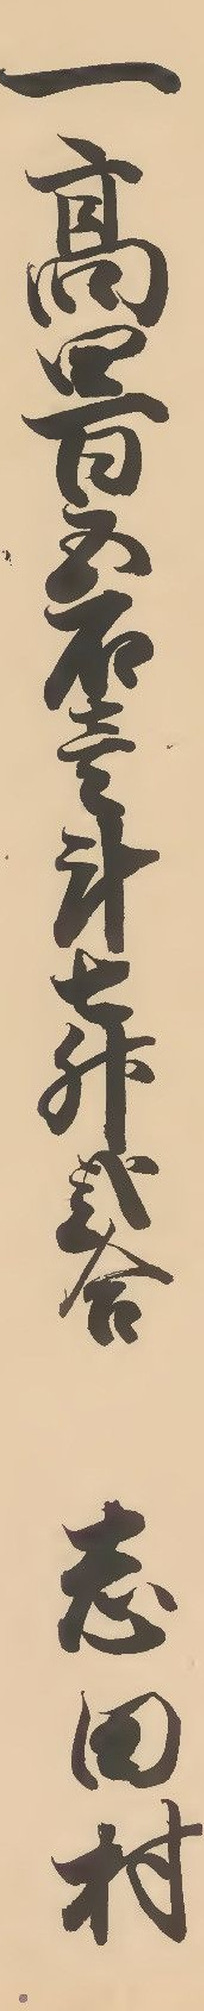一高四百五石壱斗七升弐合志田村
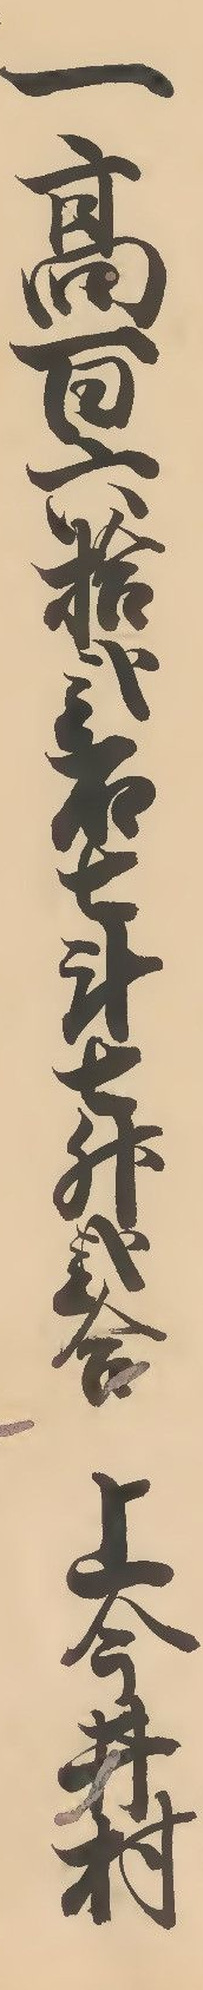一高百六拾弐石七斗七升弐合上今井村

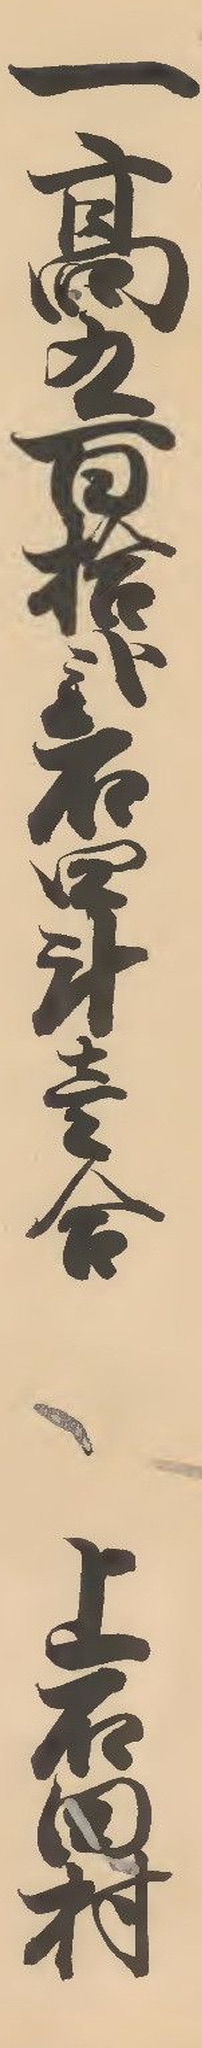一高九百拾弐石四斗壱合上石田村
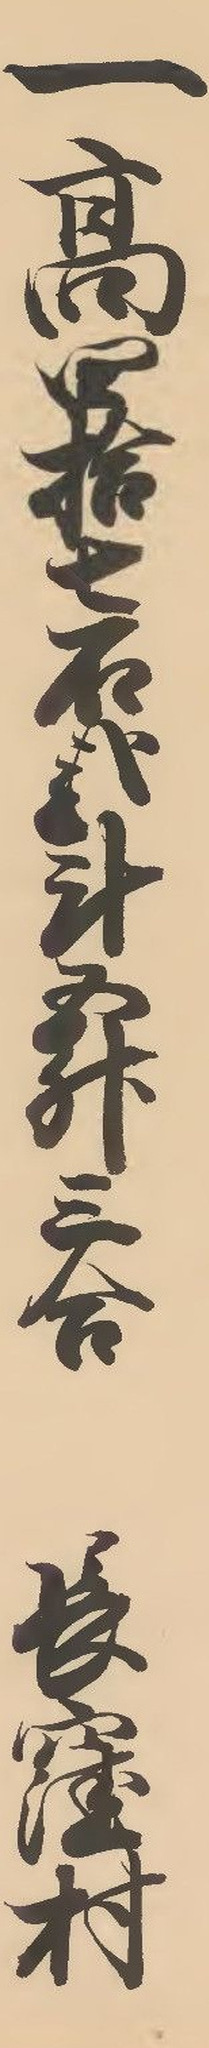一高四拾七石弐斗五升三合長窪村
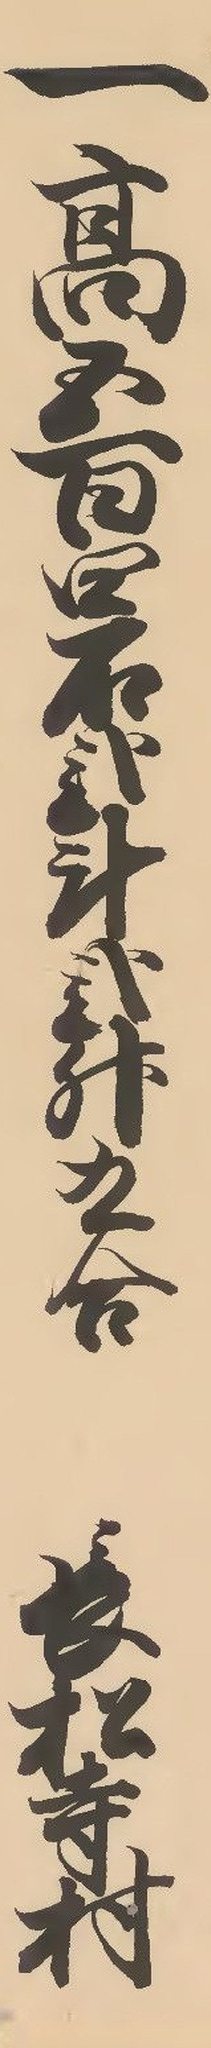一高五百四石弐斗弐升九合長松寺村
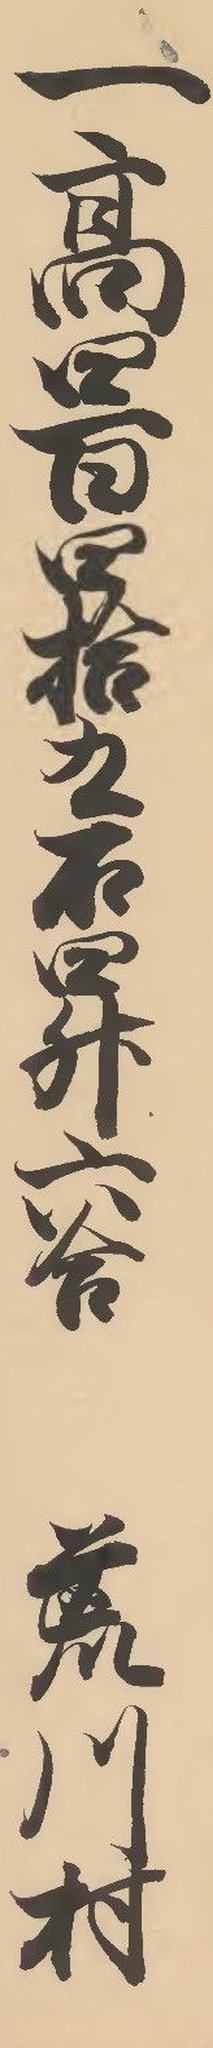一高四百四拾九石四升六合荒川村
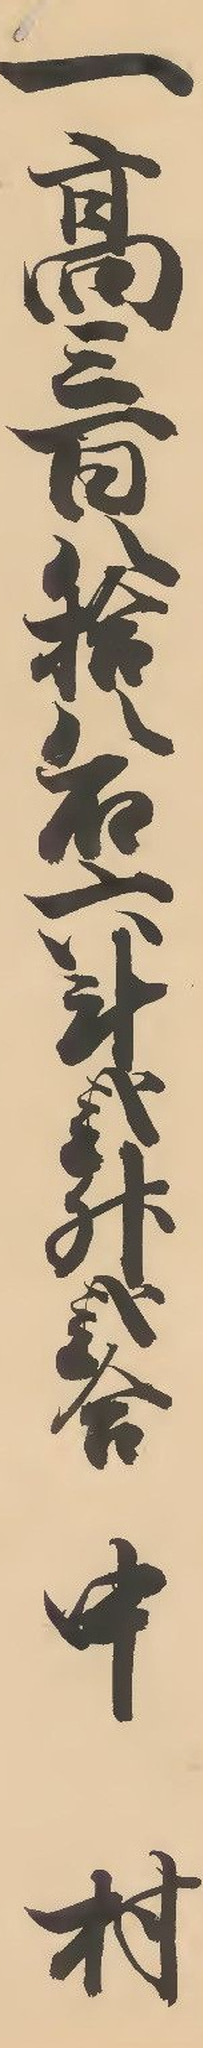一高三百八拾八石六斗弐升弐合中村
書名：甲斐国郷帳
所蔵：国立公文書館 National Archives of Japan
